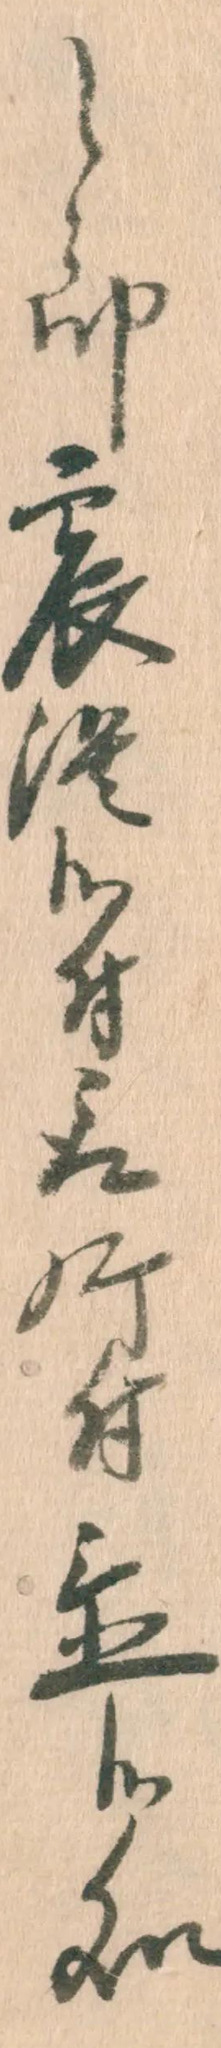之節震潰候付取片付置候処

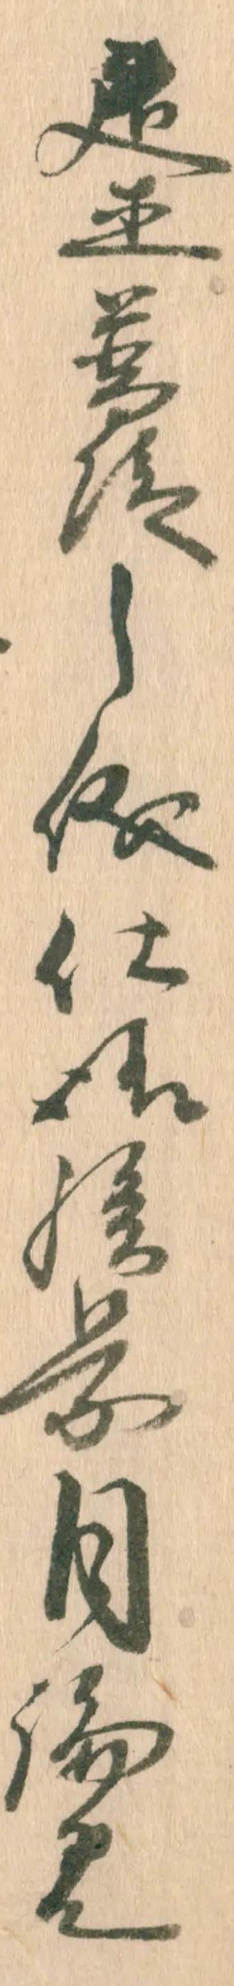建直普請之儀仕様絵図目論見
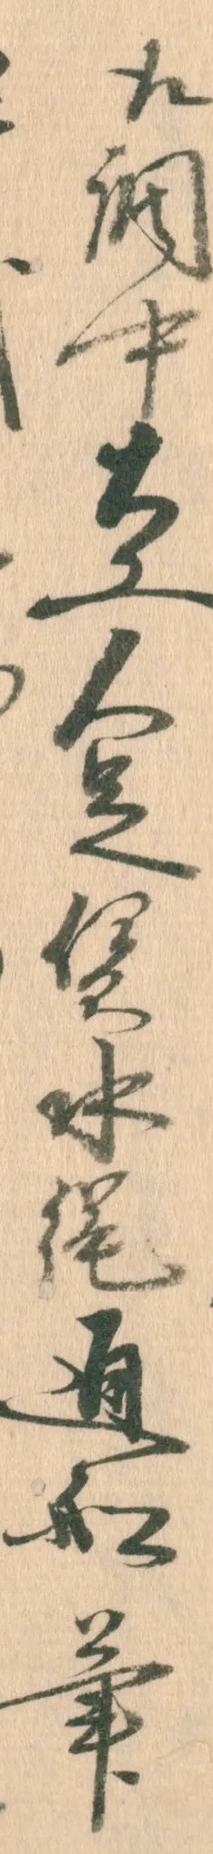取調中大工人足賃水縄通船筆
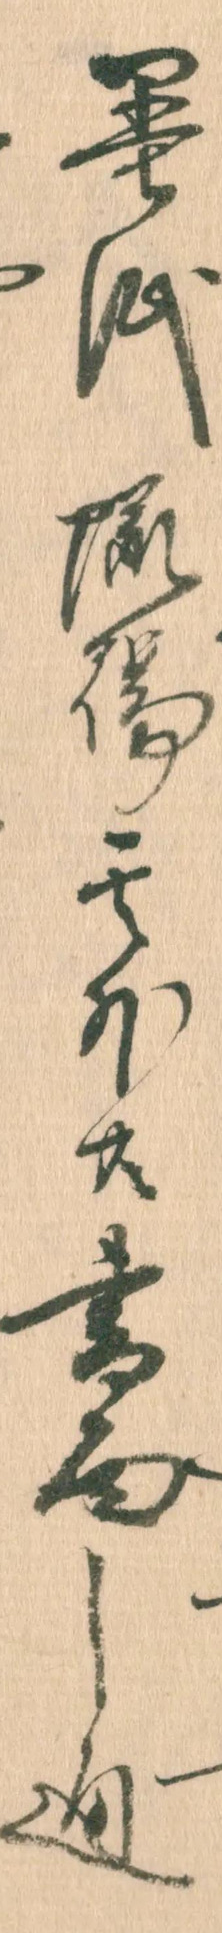墨紙蠟燭其外共書面之通
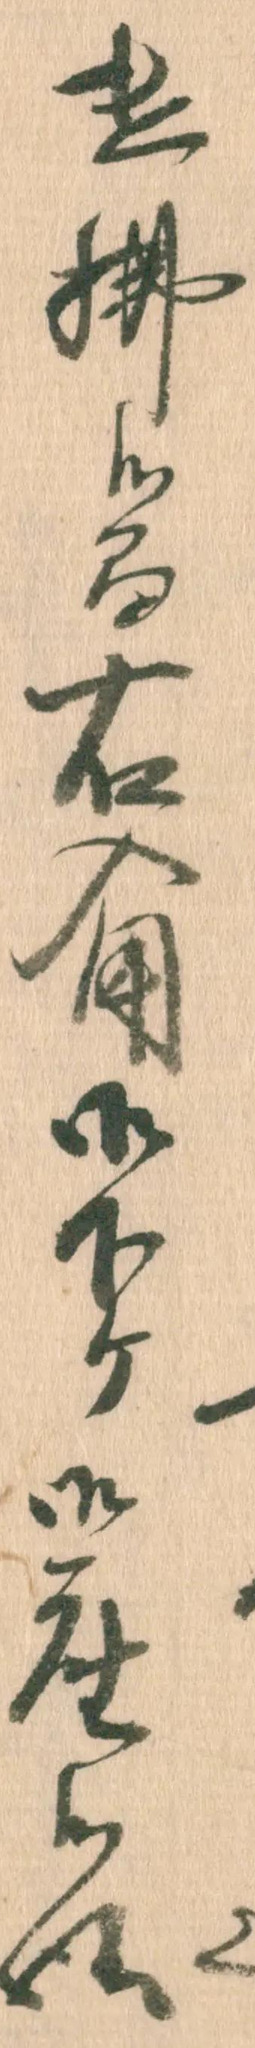懸払候間右入用御下ケ御座候様
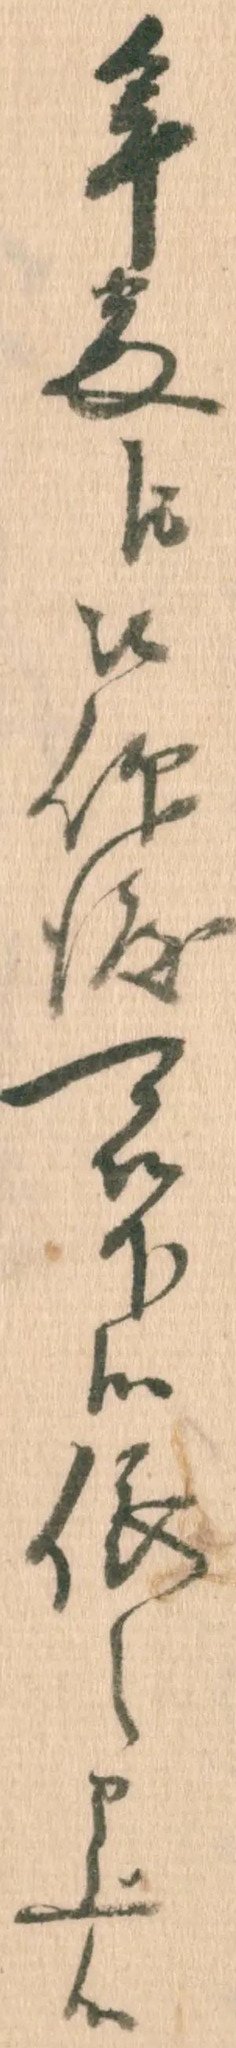年番え被仰渡可被下候依之申上候
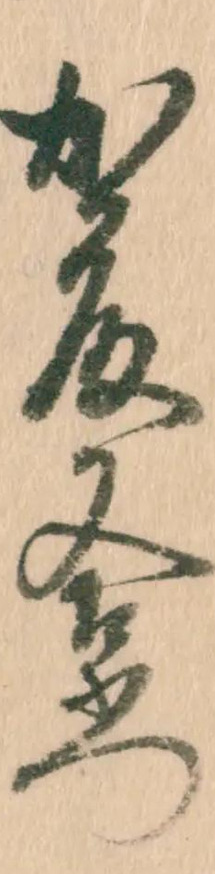加藤又左衛門

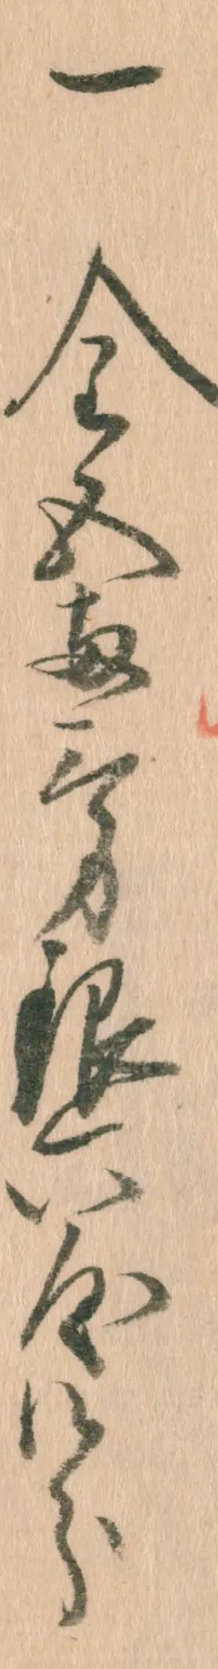一金五両三分銀六匁八分
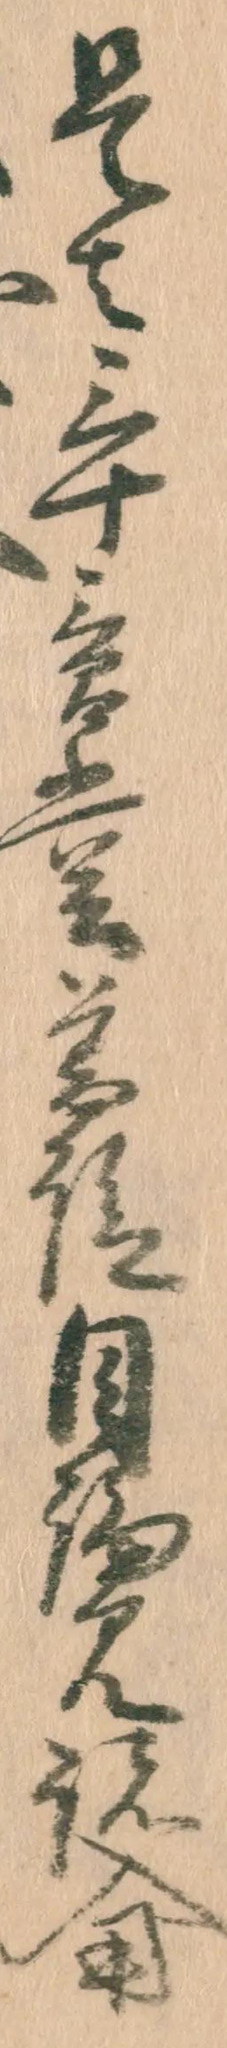是は三十三間堂普請目論見諸入用
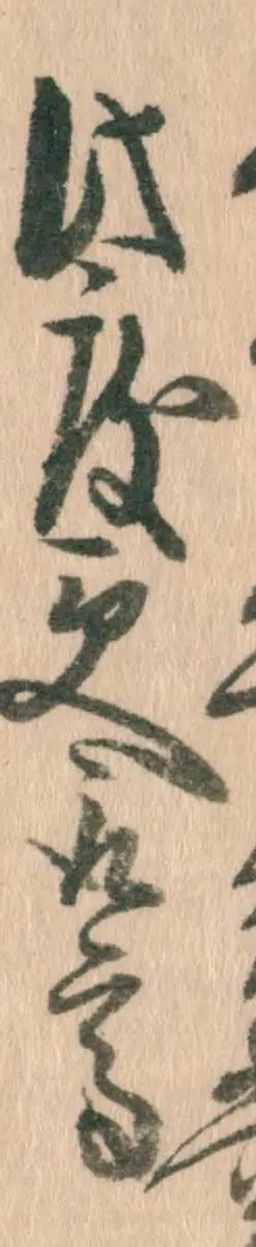此度受取高
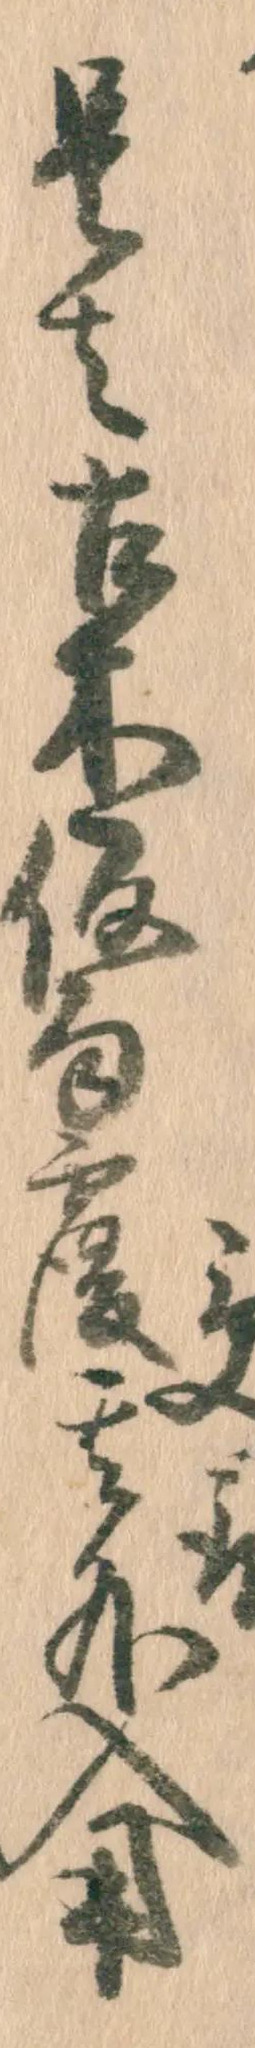是は古木仮雨覆其外入用
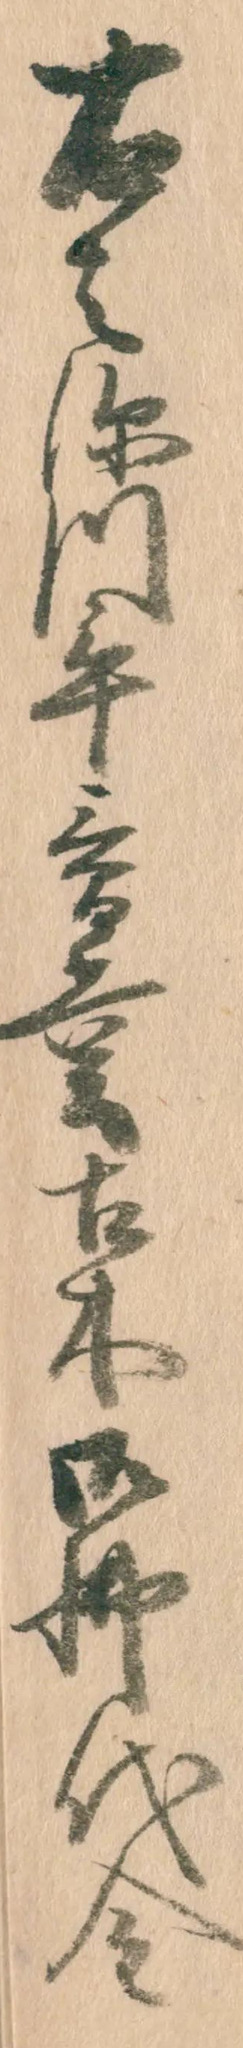右は深川三十三間堂古木御払代金

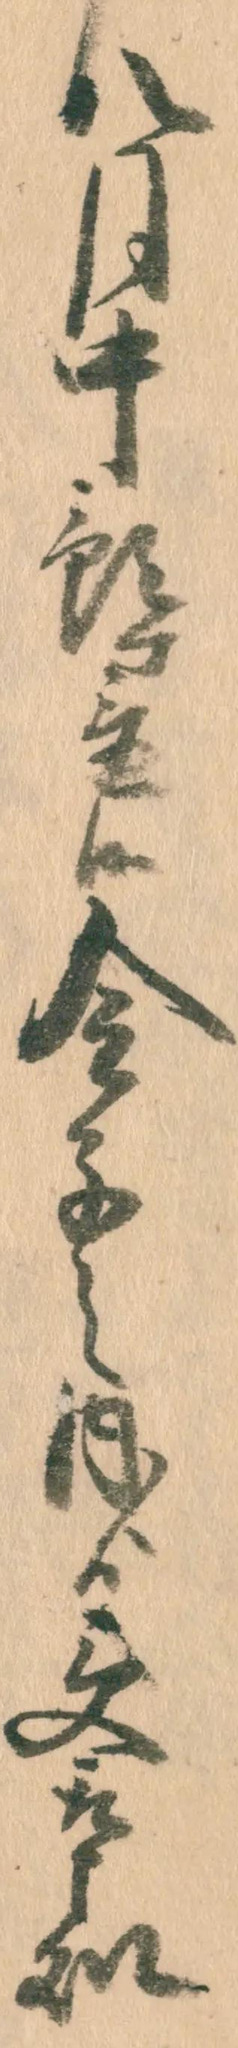八月中預ケ置候金子之内ゟ受取候処
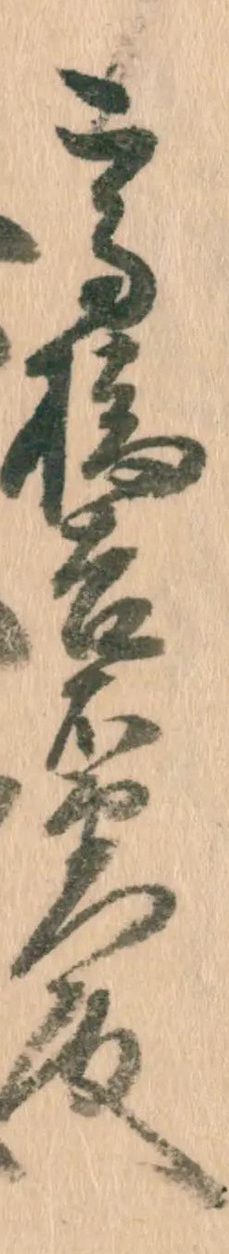高橋吉右衛門殿
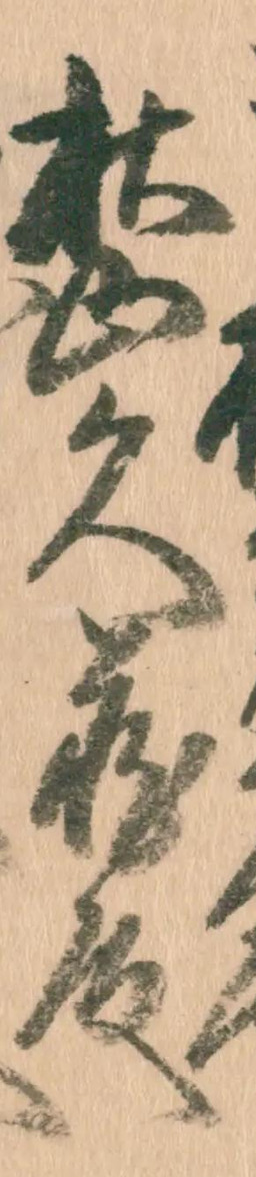秋山久蔵殿
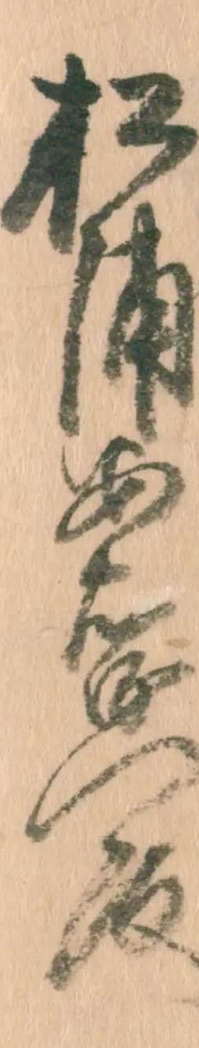松浦安右衛門殿
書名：三十三間堂. [2]
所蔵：国立国会図書館 National Diet Library, JAPAN
